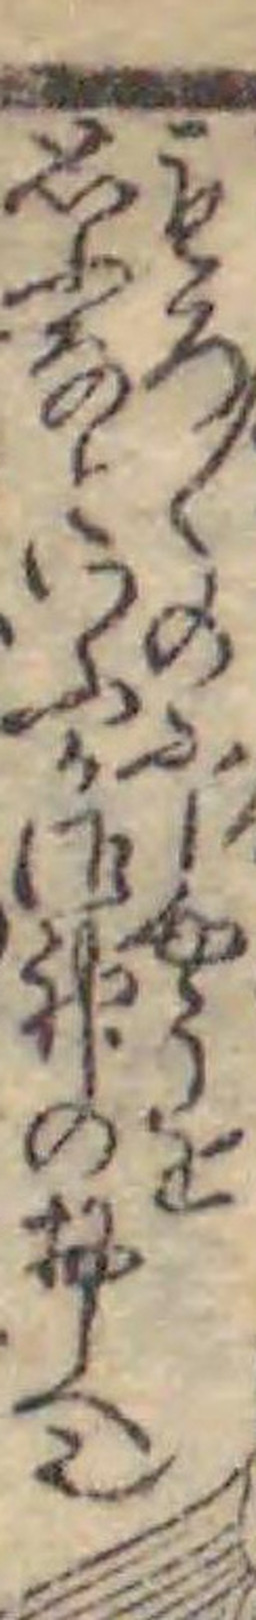思ふなといふか御神のおしへ也
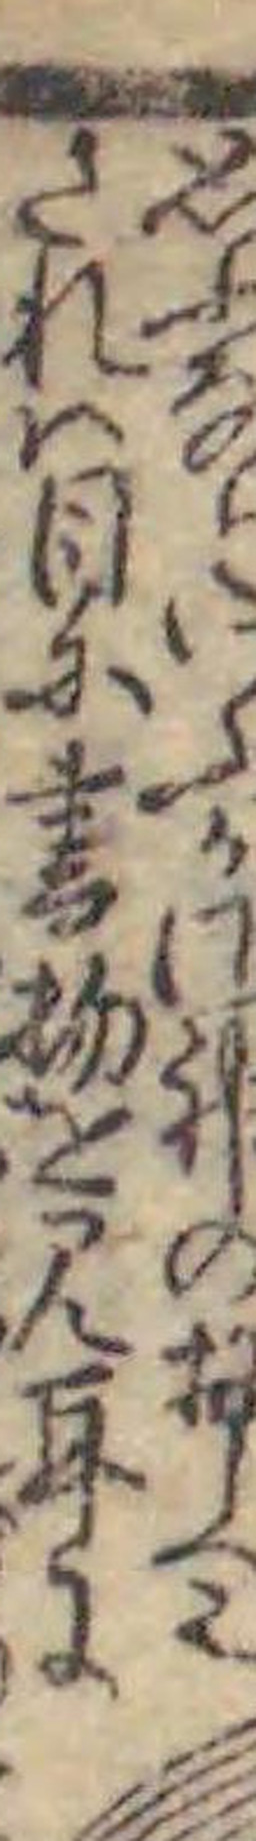されは目に書物を見耳に
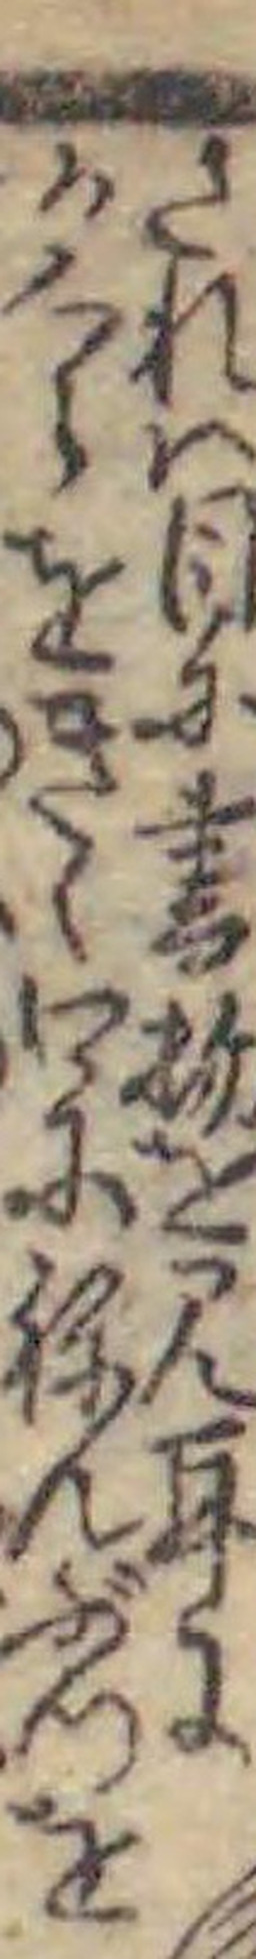かくらをきゝ口にねんぶつを
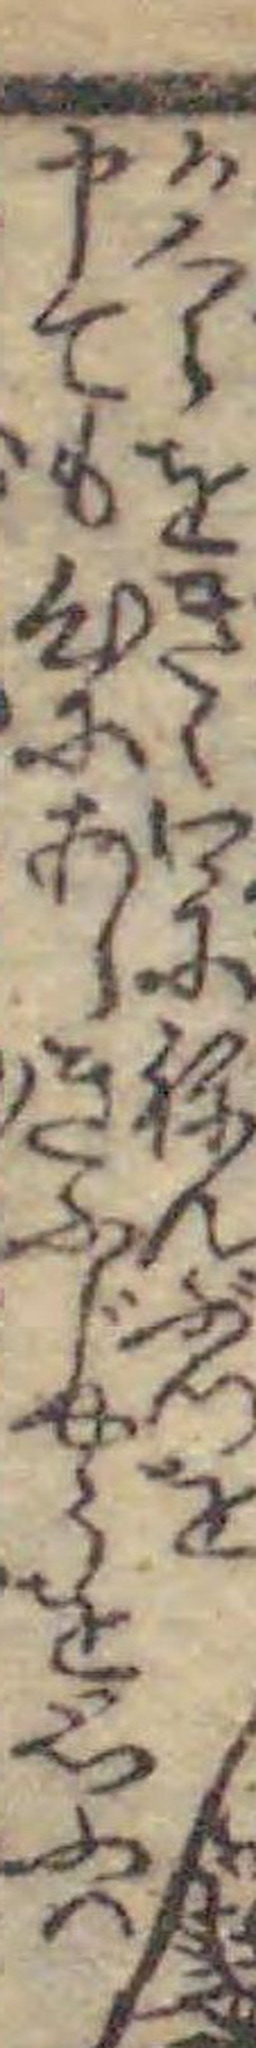申ても心にあしきふじやうを思ふは
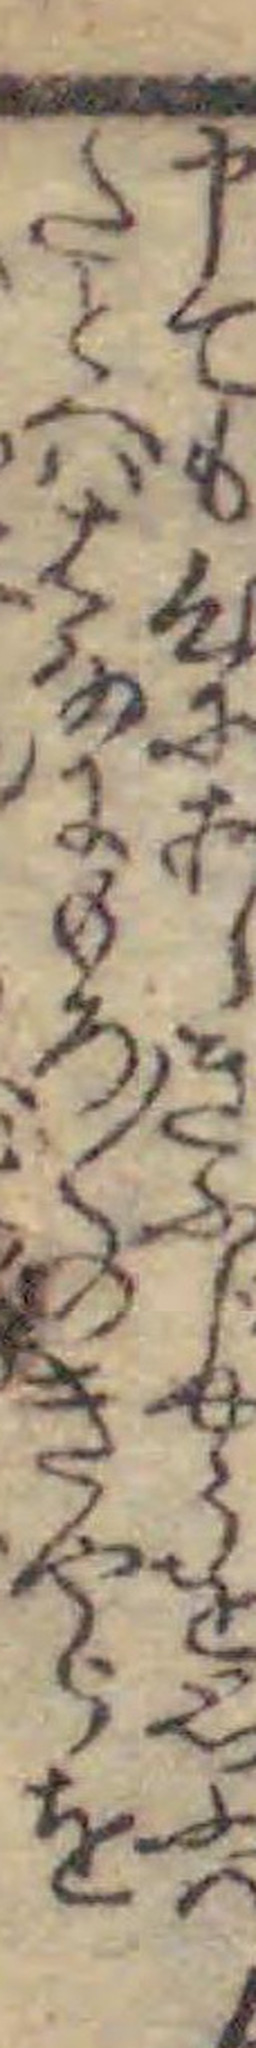たとへはなにもろ〳〵のきやらを
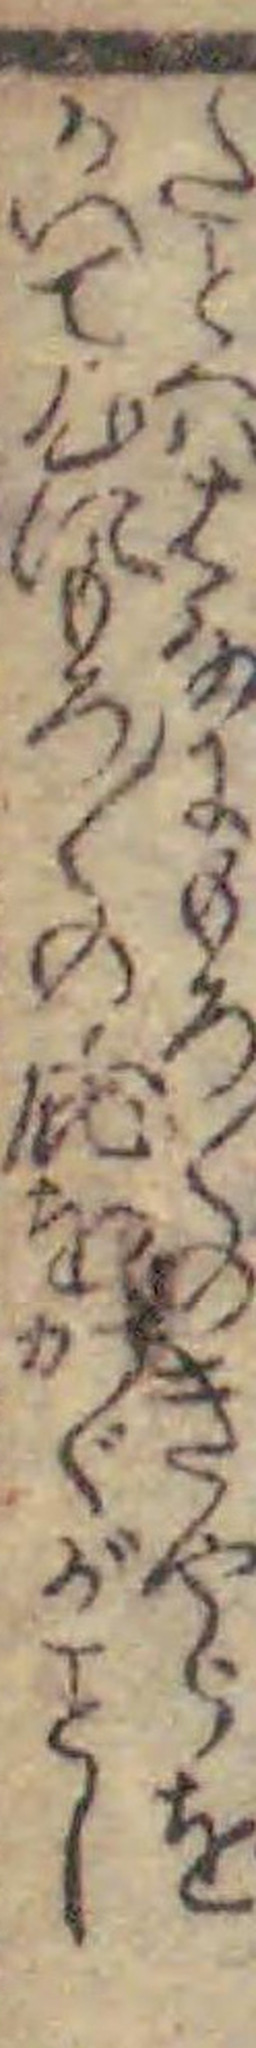かいて心にもろ〳〵の屁をかぐがことし

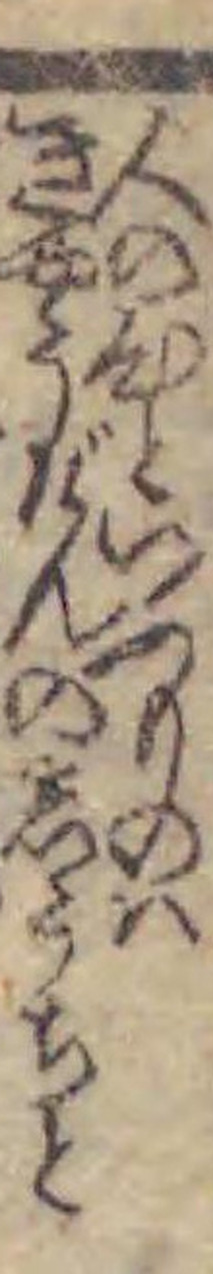きやうげんのしうちと
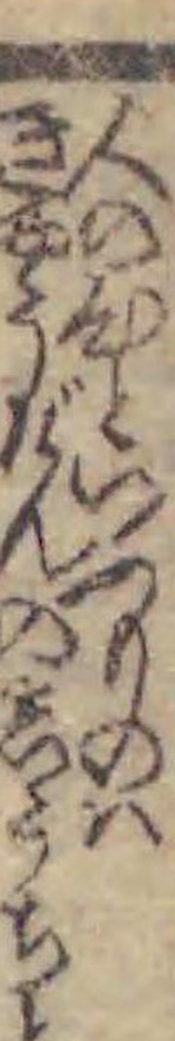人の心といふものは
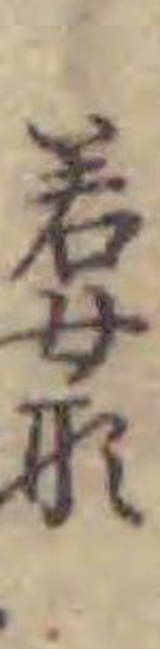若女形
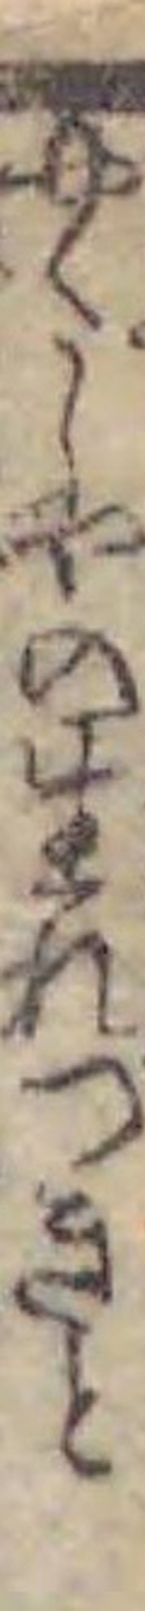やくしやの生れつきと
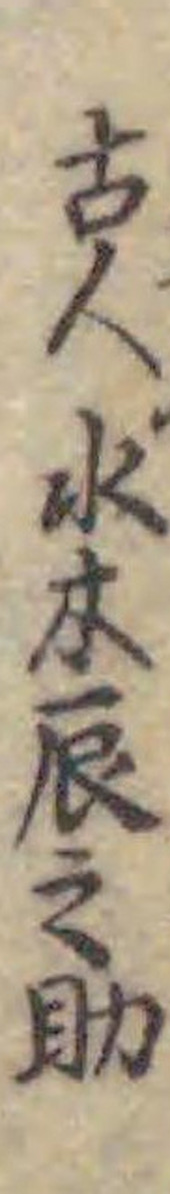古人水木辰之助
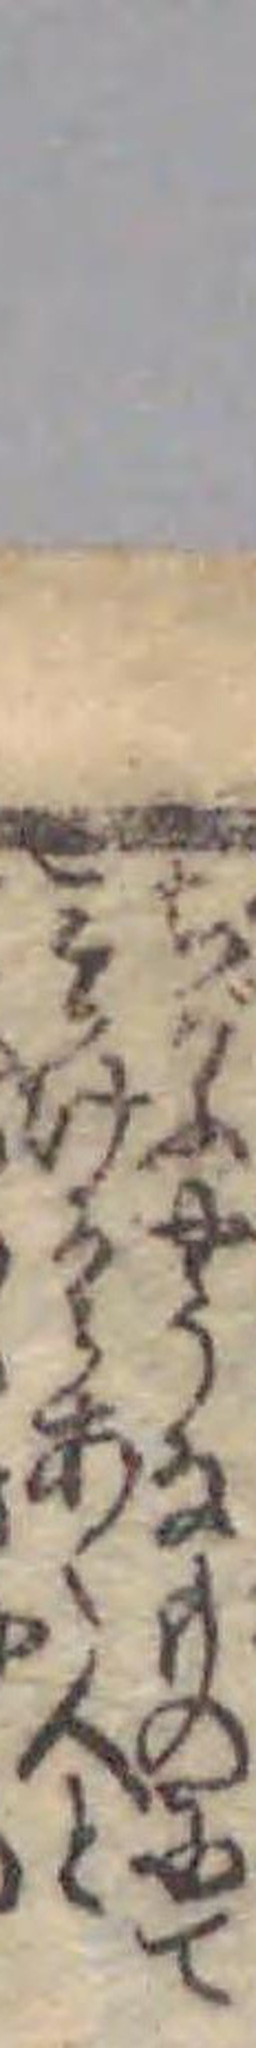みかけからあく人と
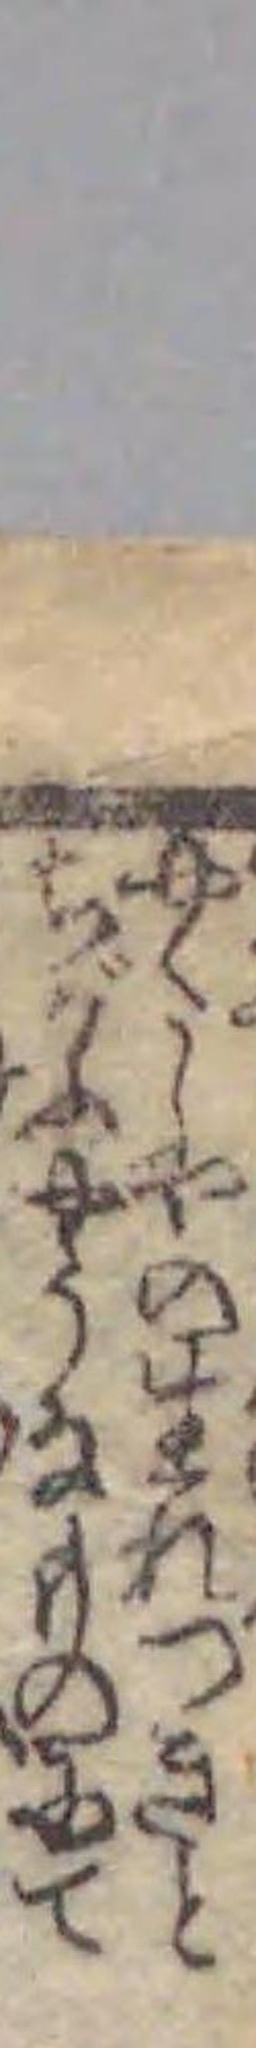ちがふやうなものにて
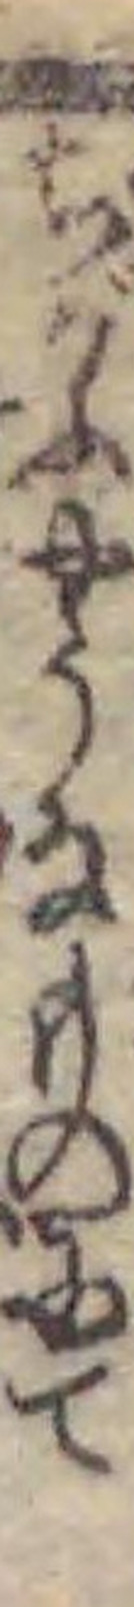ちがふやうなものにて
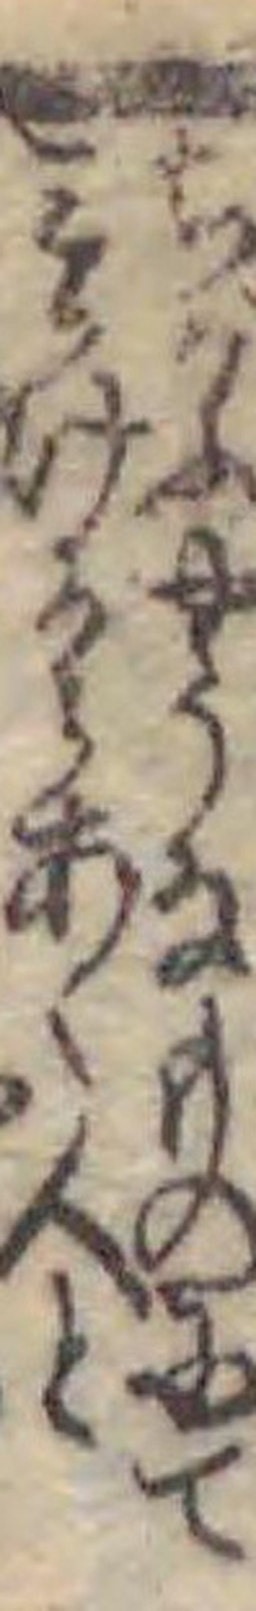みかけからあく人と
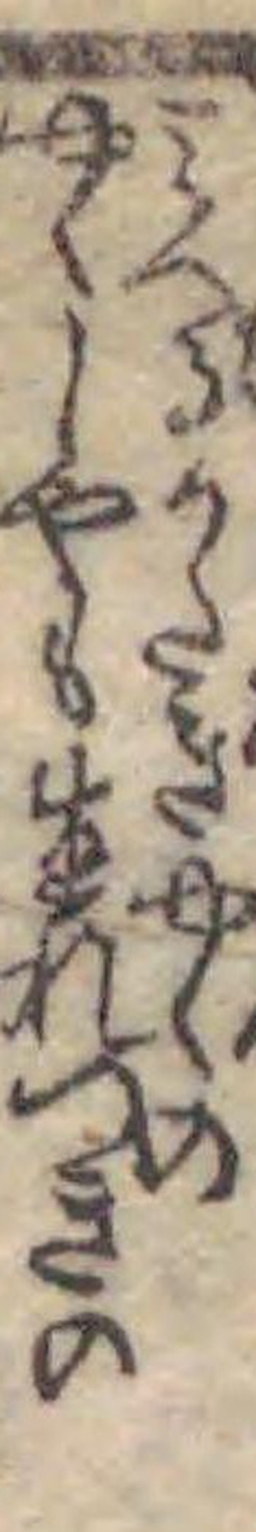やくしやも生れつきの
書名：人心鏡写絵 : 3巻
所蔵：国立国会図書館 National Diet Library, JAPAN
